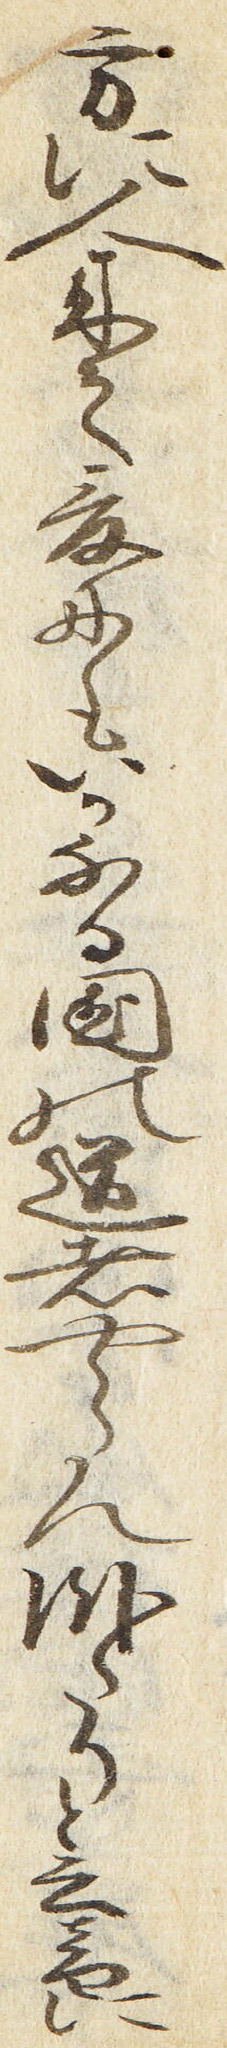方に人来て爰にもいかなる国の道者やらん臥たりと云音に
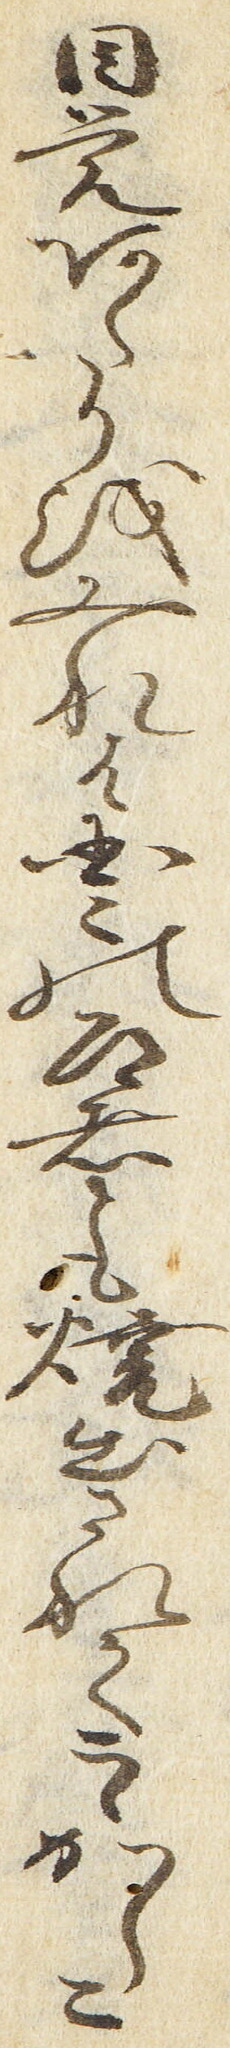目覚あたりをみれは国々の道者とも焼出されてこゝかしこ

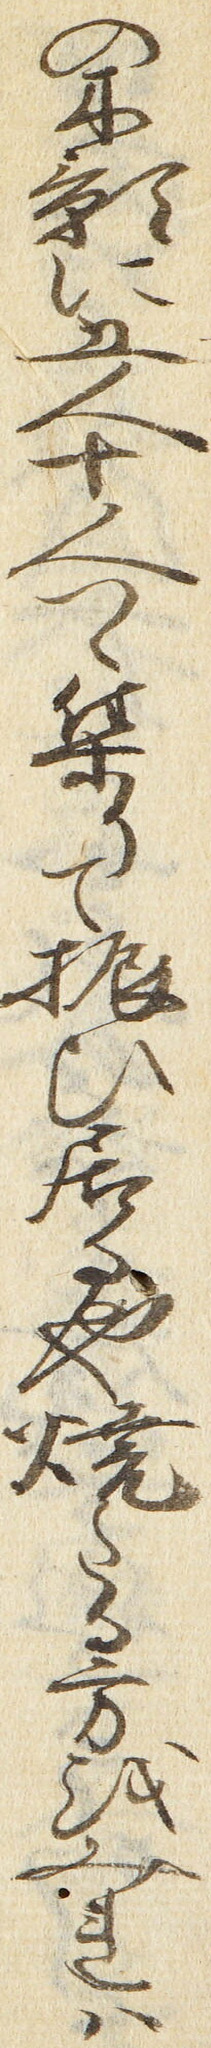の木影に五人十人ツヽ集りて振ひ居る也焼たる方をみれは
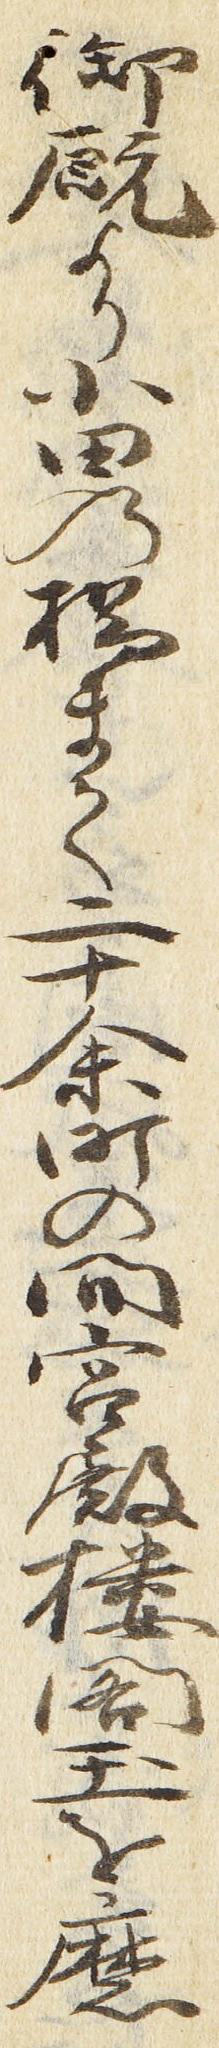御厩より小田の橋まて二十余町の間宮殿楼閣玉を磨
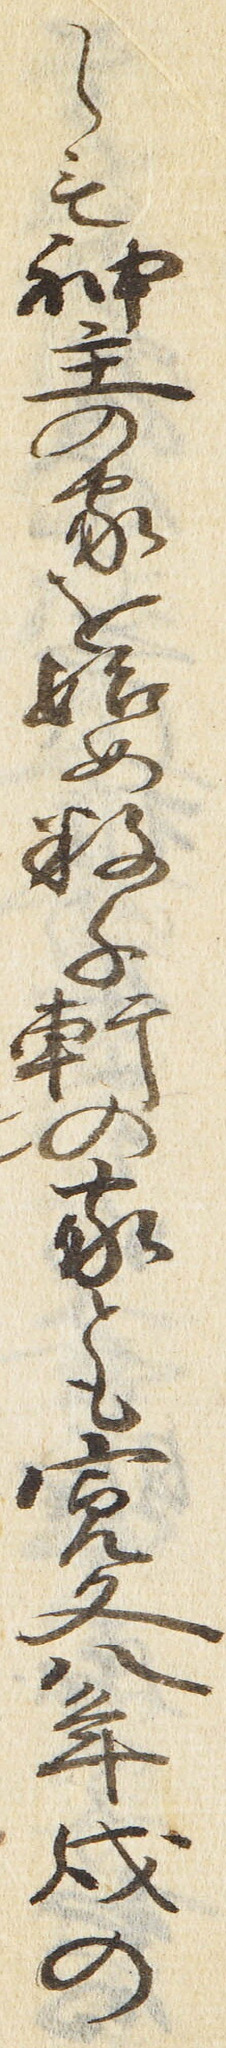しも神主の家を始め数千軒の家とも寛文八年戌の
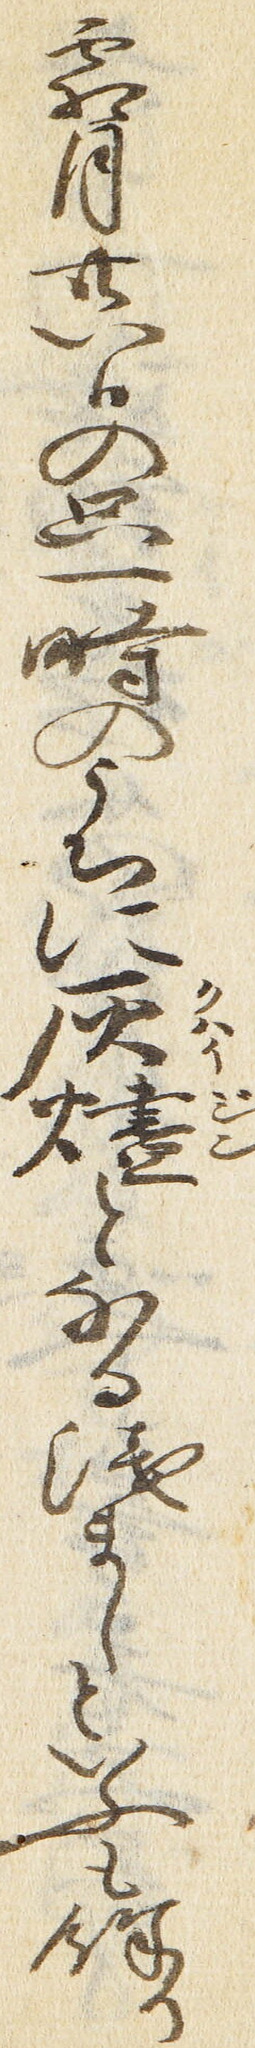霜月廿八日の只一時のうちに灰燼となる浅ましといふも余り
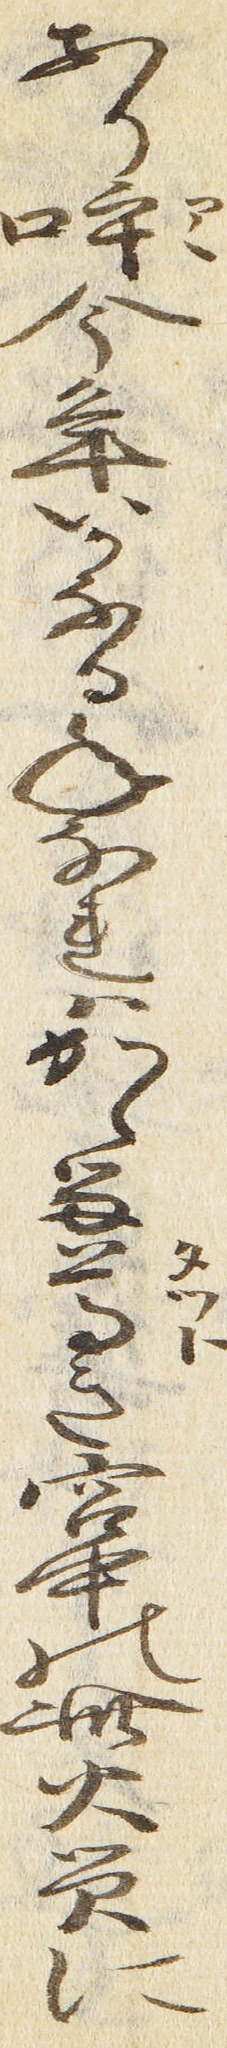あり呼今年いかなる年なれはかゝる尊き宮中の此火災に
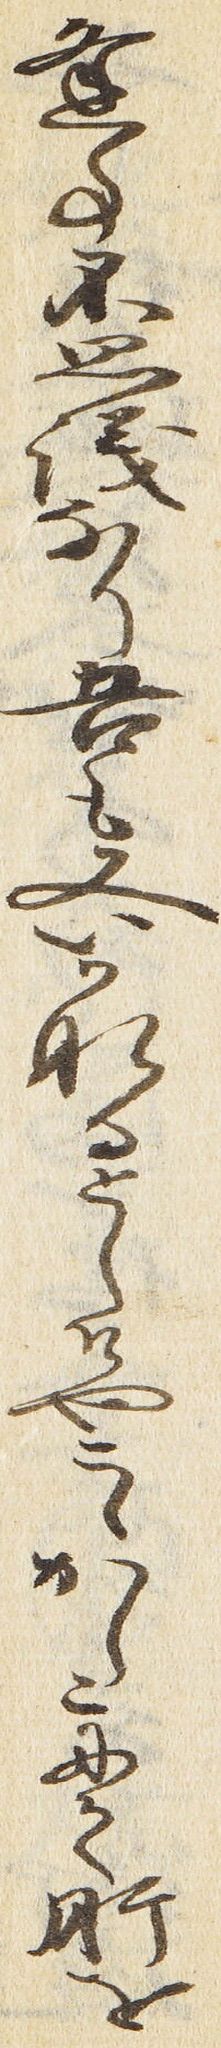逢事不思議なり吾も又いかなるとしそやこゝかしこにて肝を
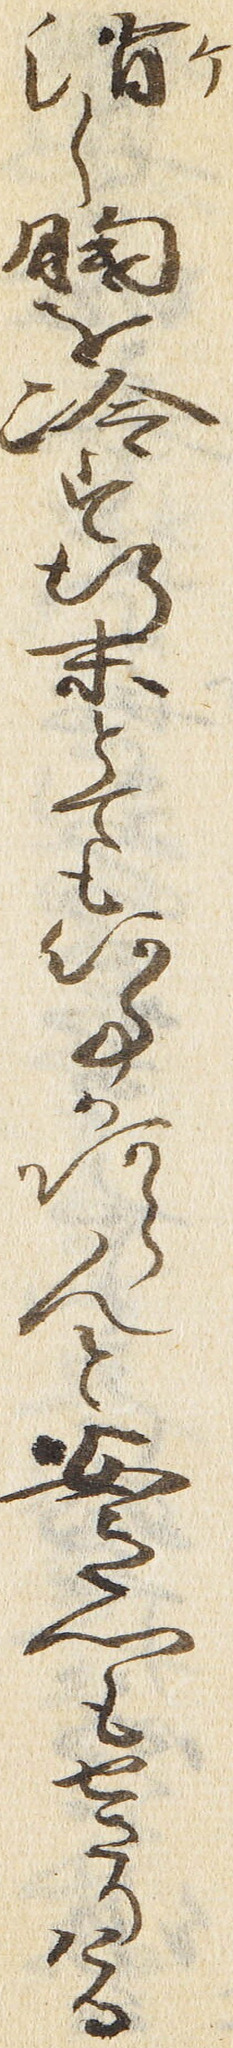消し胸を冷す行末とても何事かあらんと安き心もせさりける
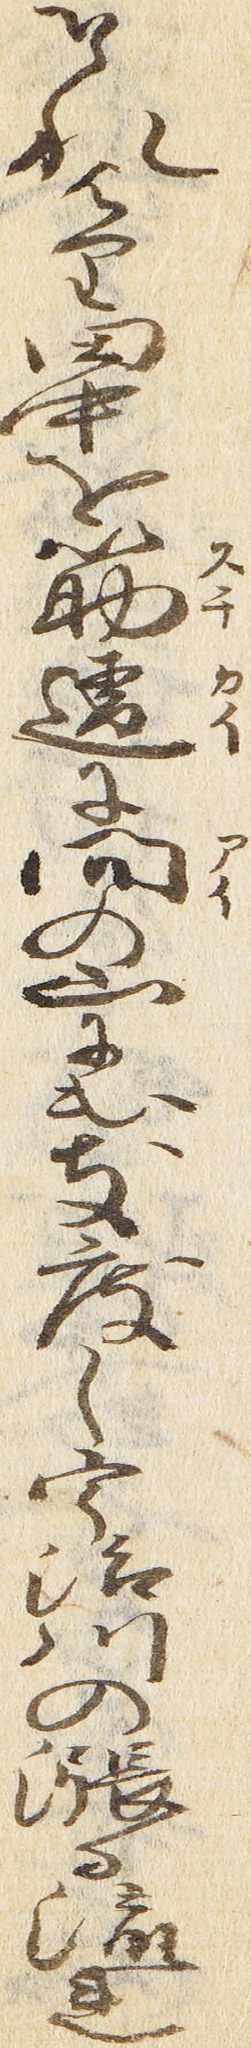それより田中を筋違に間の山に出支度し宇治川の漲る流れ
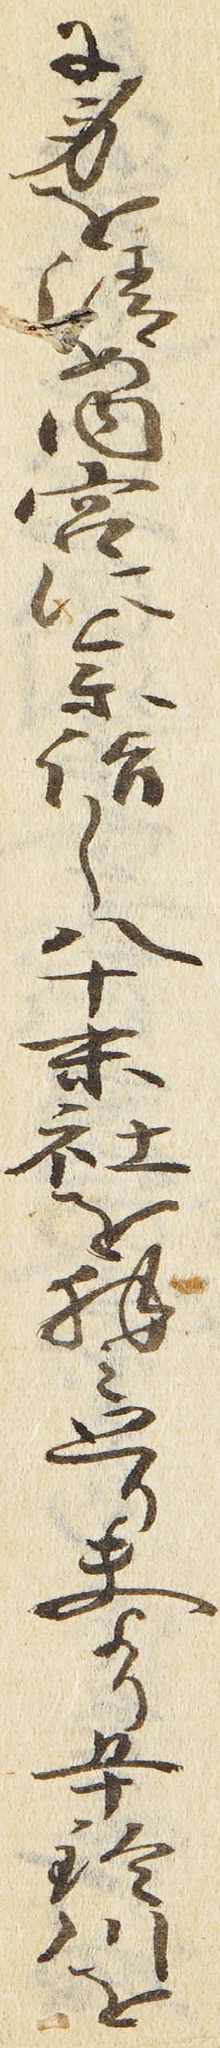に身を清め内宮に参詣し八十末社を拝み廻り夫より五十鈴川を
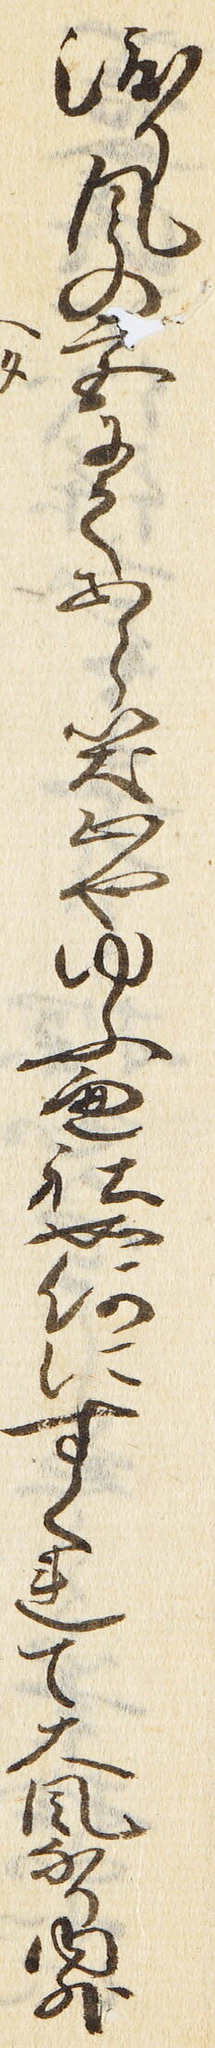渡り風の宮にてあら笑止やゆふへ社如何にすくれて大風なり内外
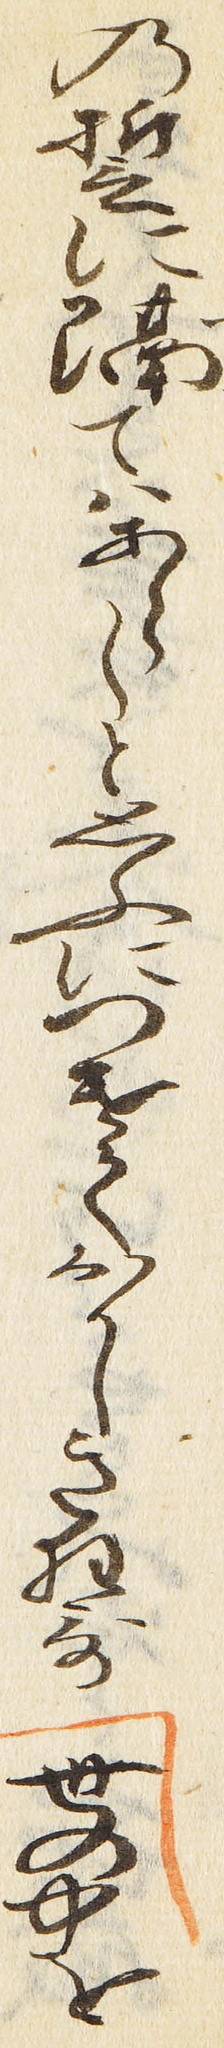の誓に隔てはあらしと思ふにつけておかしき狂歌「世の中を
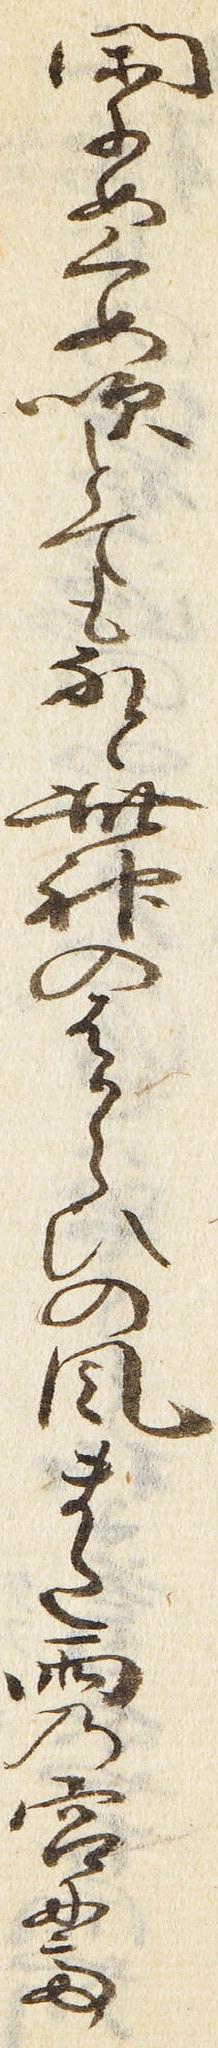閑にめくめ吹とてもなと此神のはからひの風また雨の宮にて
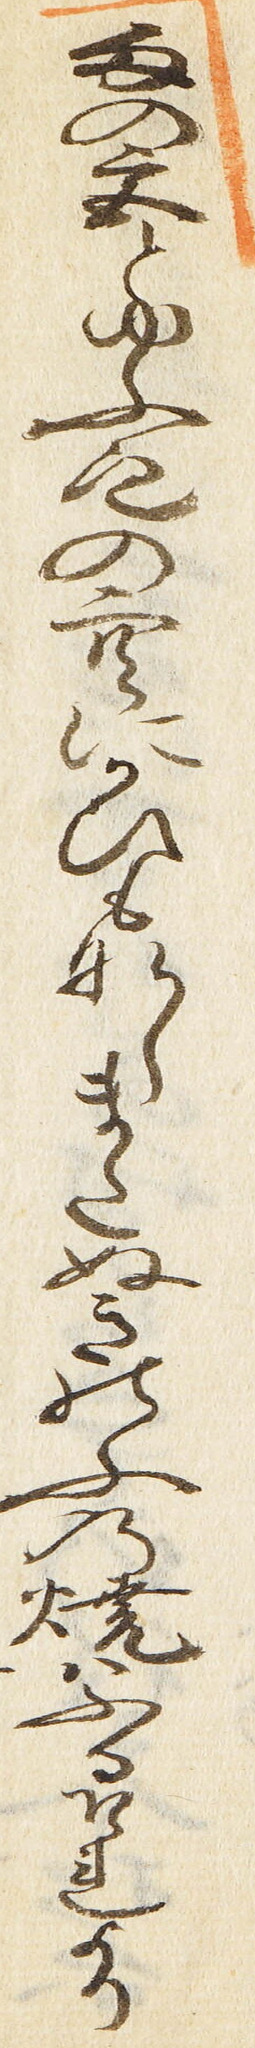「雨の宮とゆふへの空にかひもなしまたぬきのふの焼はふるそれより
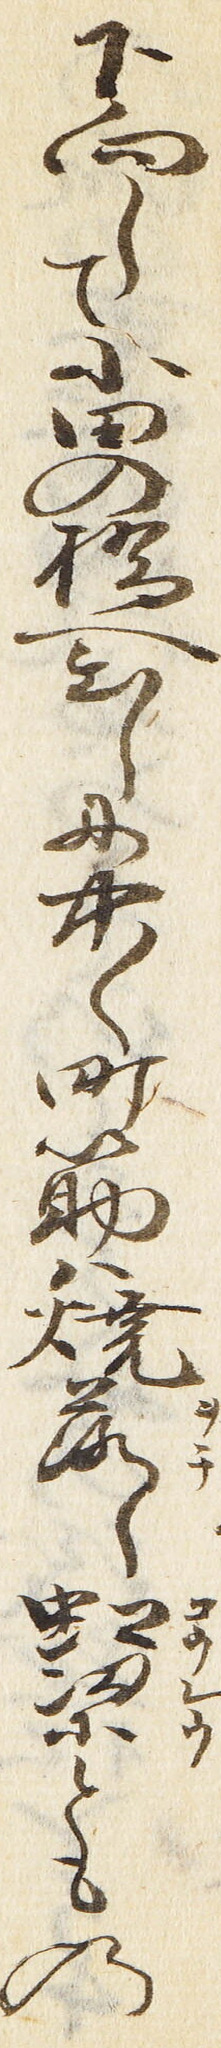下向して小田の橋へ至しに中〳〵町筋は焼落し虹梁ともの
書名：海陸世話日記
